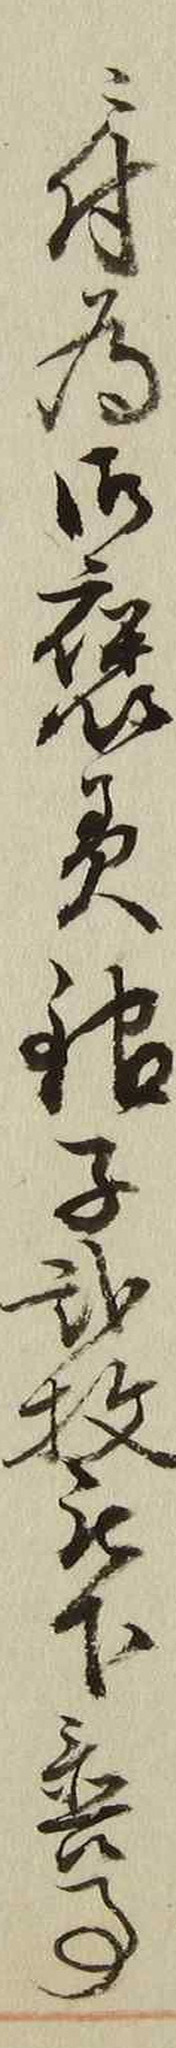ニ付為御褒美銀子弐枚被下置候事
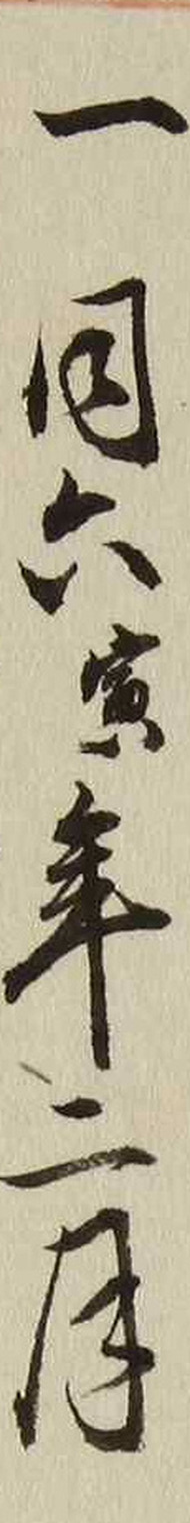一同六寅年二月
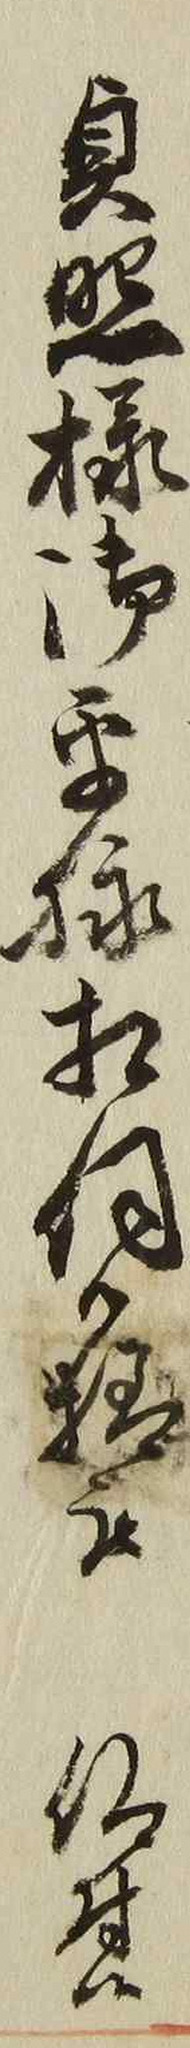貞照様御平脈相伺候様被仰付候
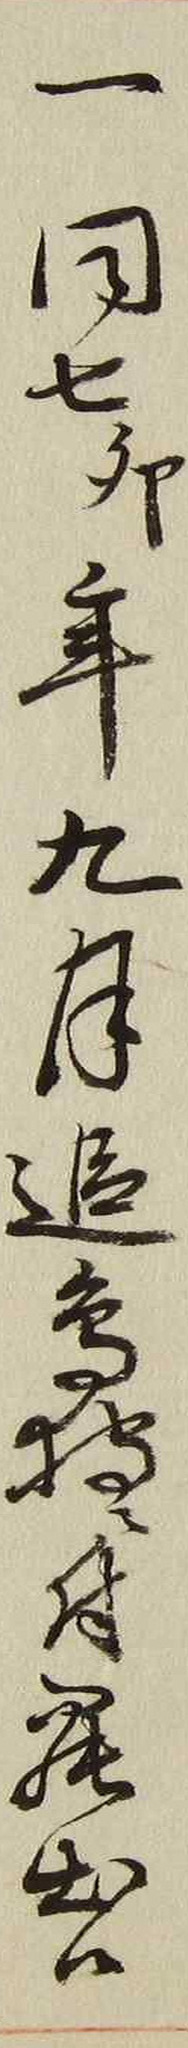一同七卯年九月追鳥狩ニ付罷出候
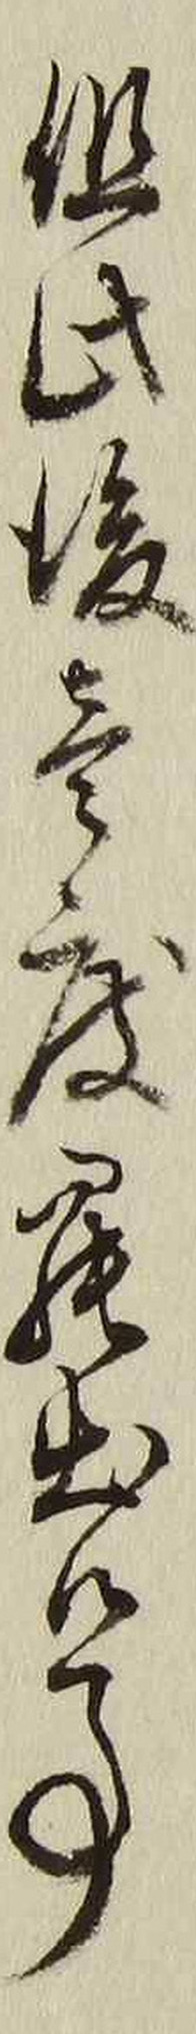但此後壱度罷出候事
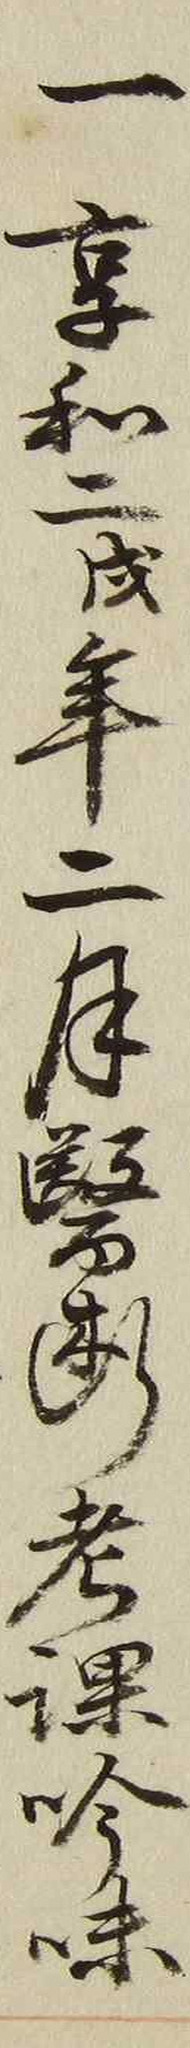一享和二戌年二月医術考課吟味
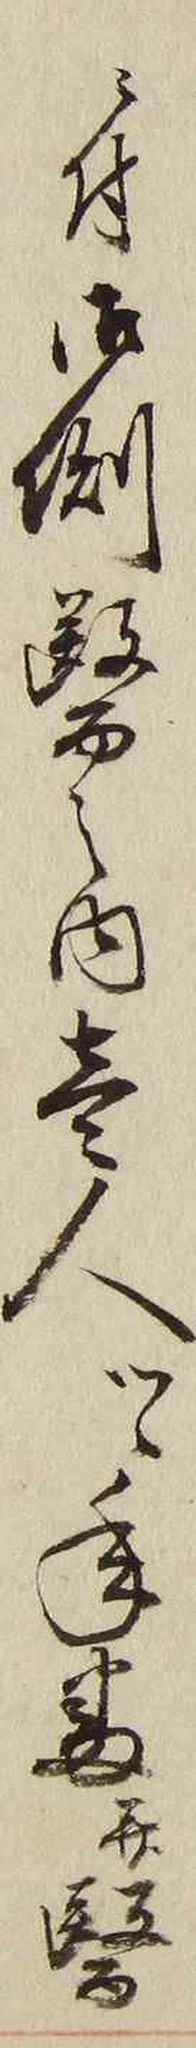ニ付御側医之内壱人ツヽ年番并医

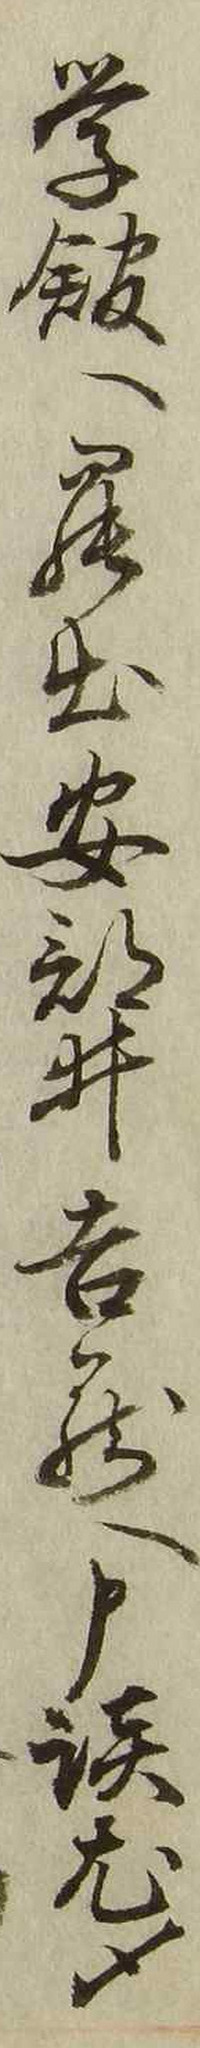学館へ罷出安部井吉蔵へ申談尤〆
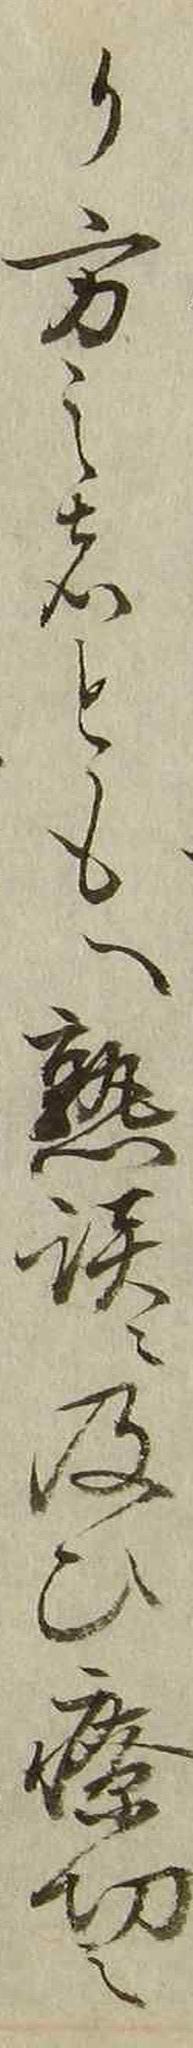り方之者ともへ熟談ニ及ひ療功之
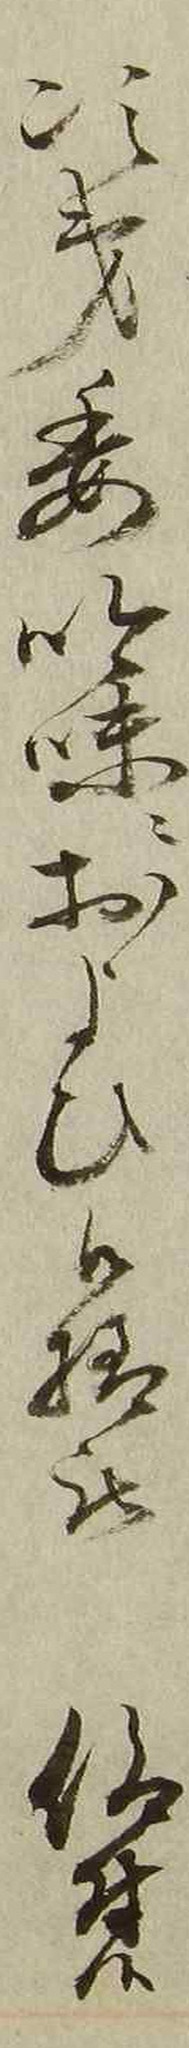次第委吟味ニおよひ候様被仰付候
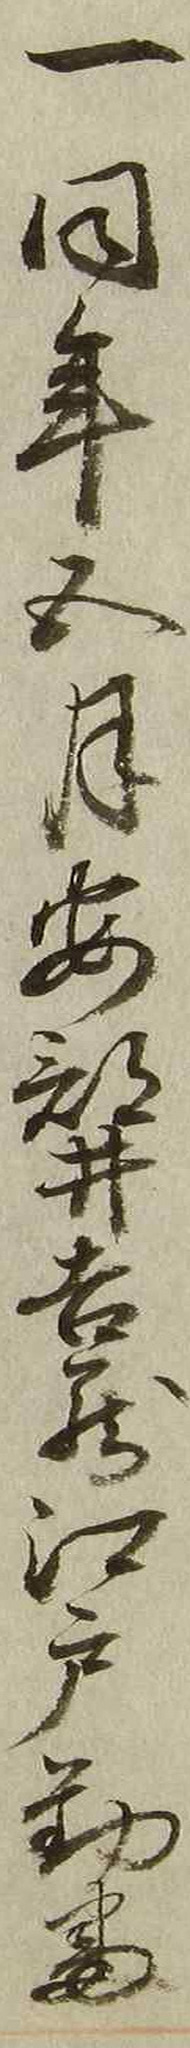一同年五月安部井吉蔵江戸勤番
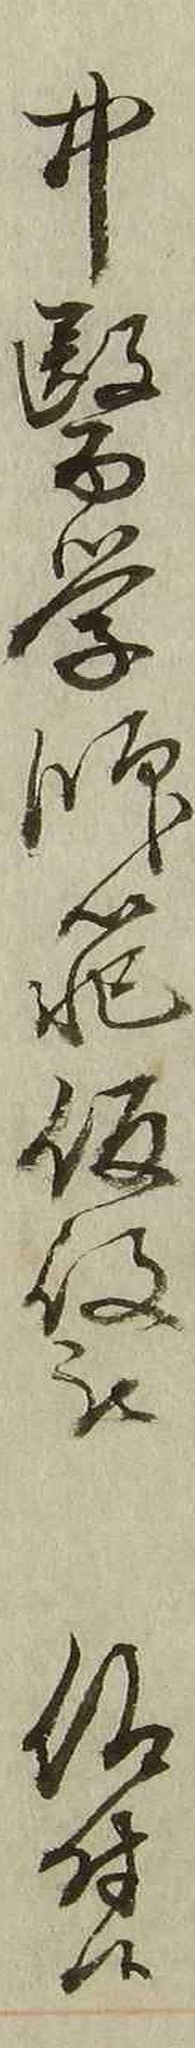中医学師範仮役被仰付候
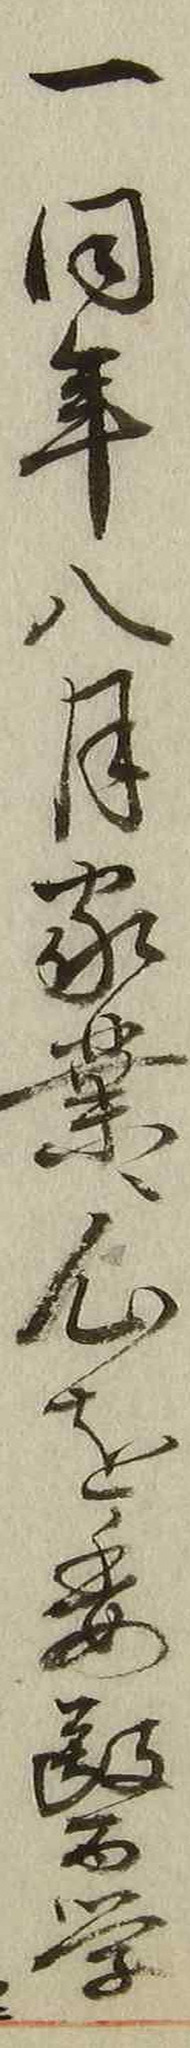一同年八月家業へ心を委医学
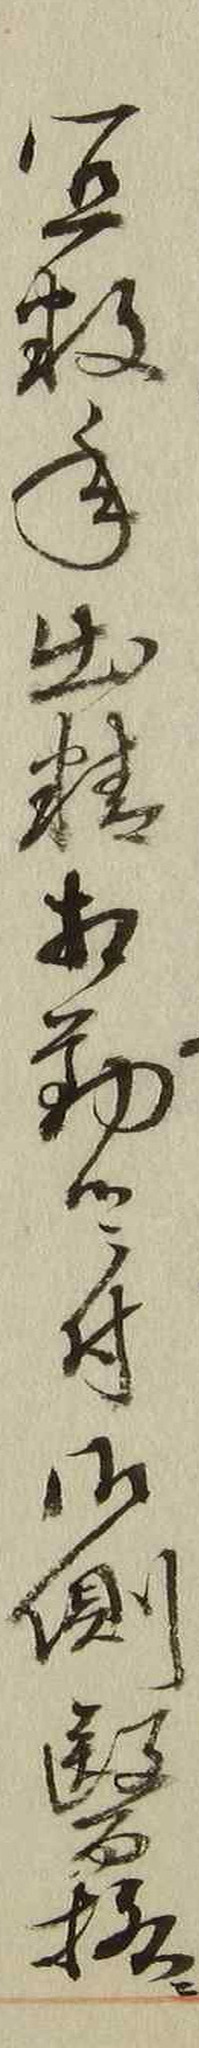宜数年出精相勤候ニ付御側医格ニ
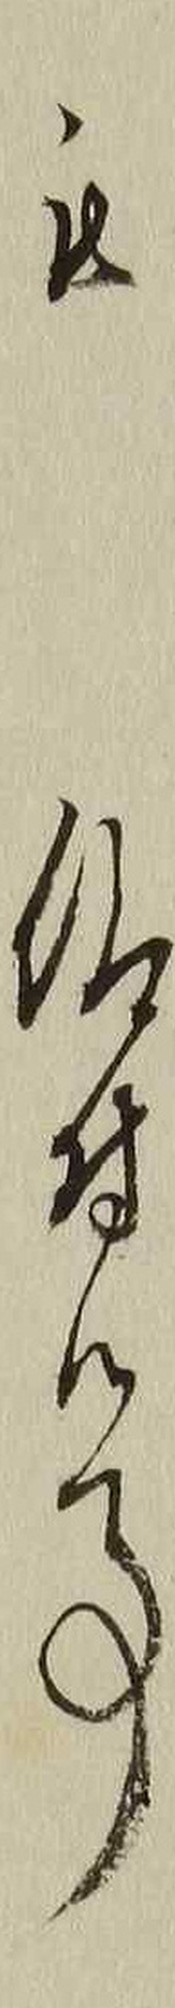被仰付候事
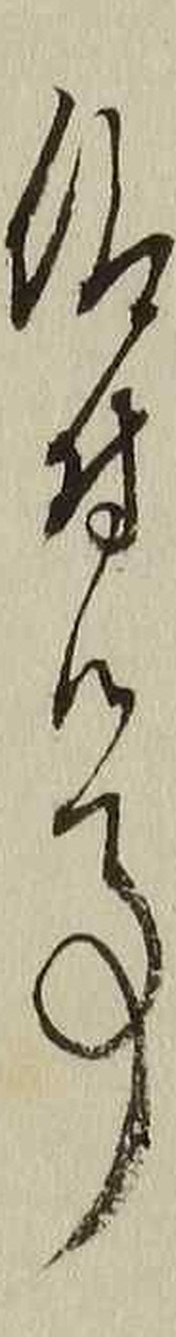仰付候事
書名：諸士系譜　巻之39　は之部7
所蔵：会津若松市立会津図書館
